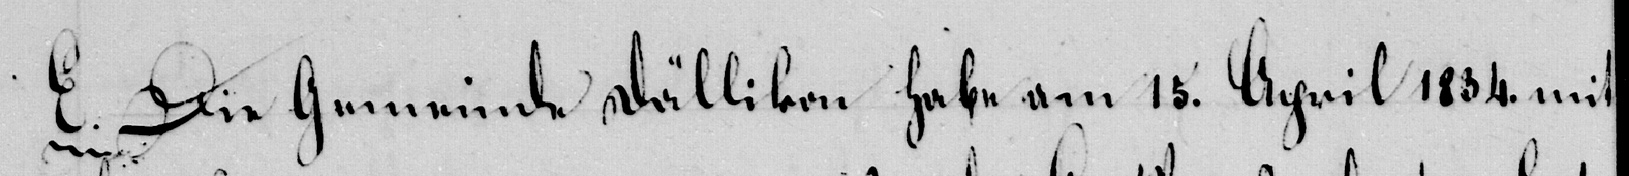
E. Die Gemeinde Dällikon habe am 15. April 1834. mit
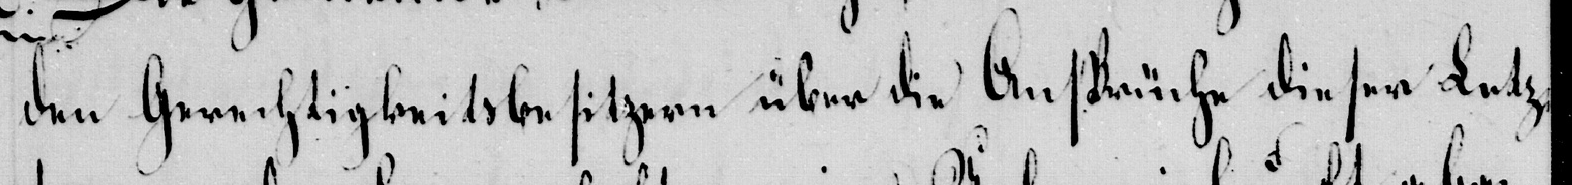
den Gerechtigkeitsbesitzern über die Ansprüche dieser Letz¬
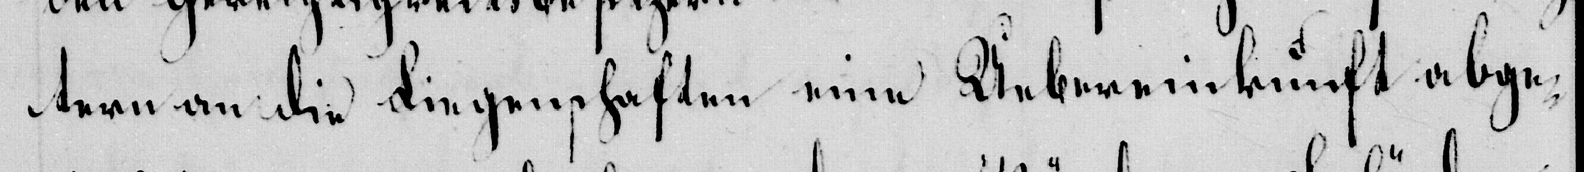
tern an die Liegenschaften eine Uebereinkunft abge¬
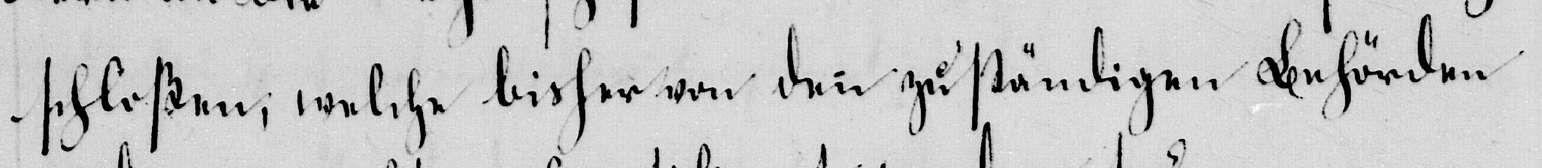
schloßen, welche bisher von den zuständigen Behörden
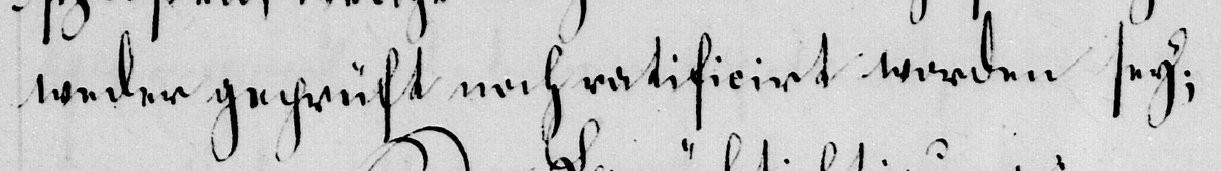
weder geprüft noch ratificirt worden sey;
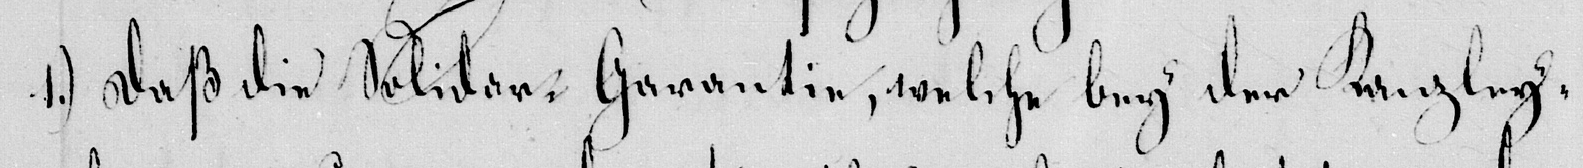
1.) Daß die Solidar-Garantie, welche bey der Kanzley¬
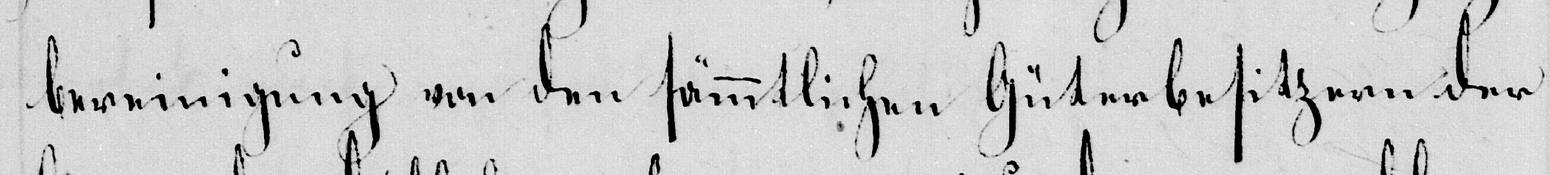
bereinigung von den sämmtlichen Güterbesitzenden der
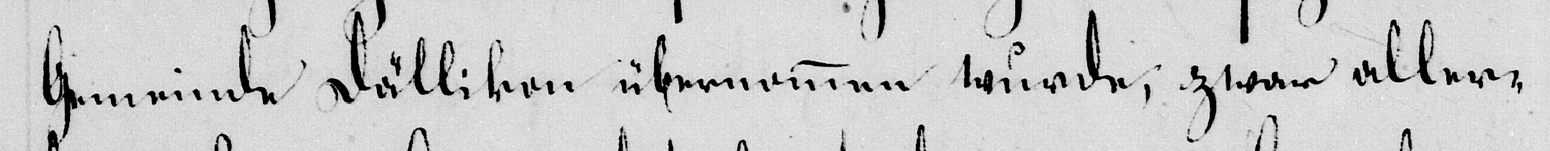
Gemeinde Dällikon übernommen wurde, zwar aller¬
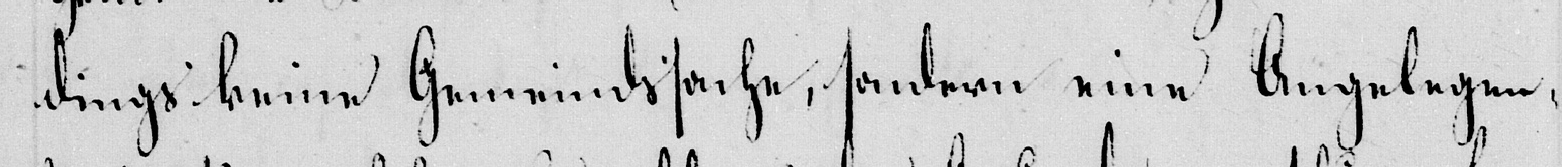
dings keine Gemeindssache, sondern eine Angelegen¬
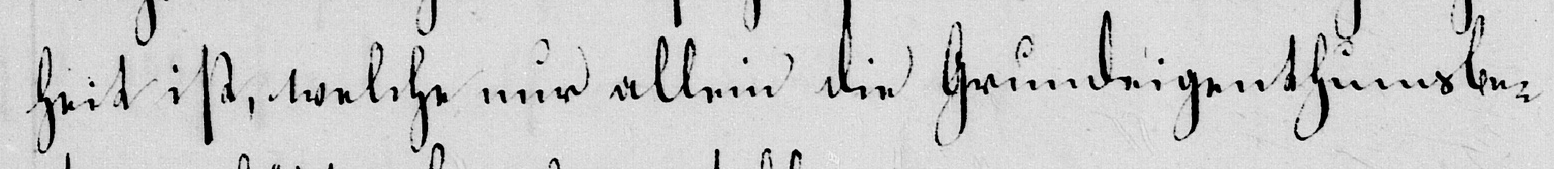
heit ist, welche nur allein die Grundeigenthumsbe¬
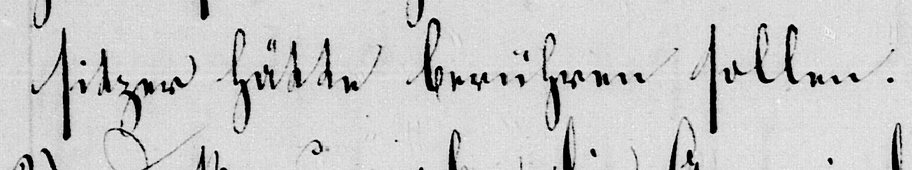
sitzer hätte berühren sollen.
